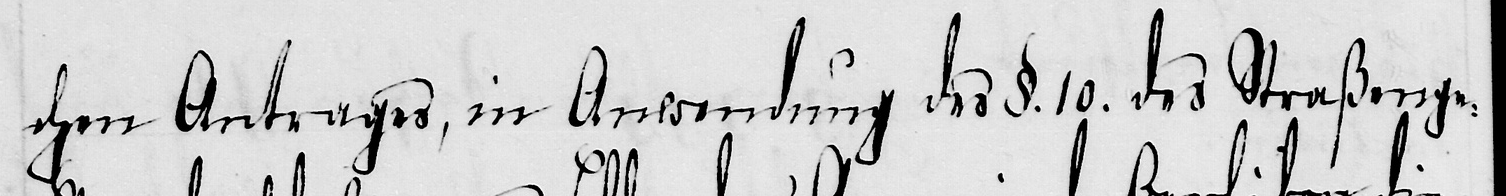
chen Antrages, in Anwendung des §. 10. des Straßengese¬
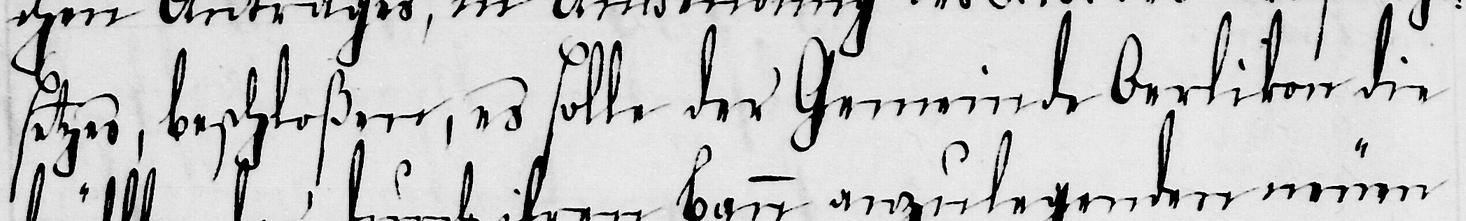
tzes, beschloßen, es solle der Gemeinde Oerlikon die
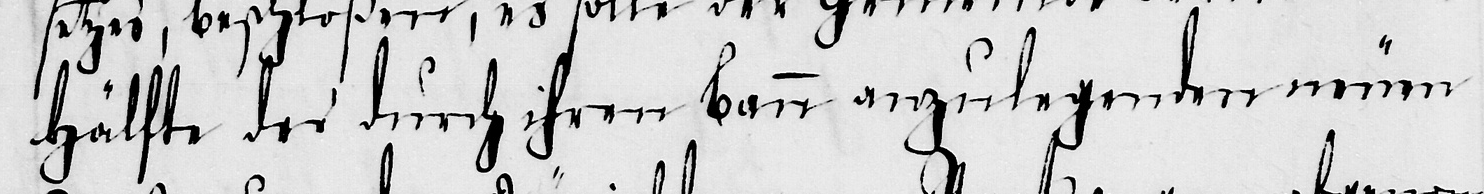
Hälfte der durch ihren Bau anzulegenden neuen
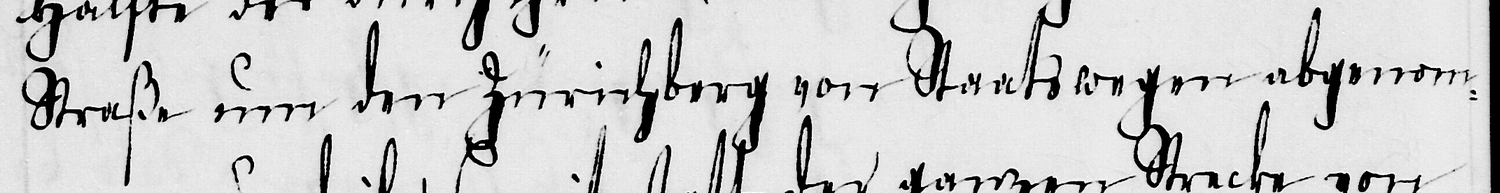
Straße um den Zürichberg von Staatswegen abgenom¬
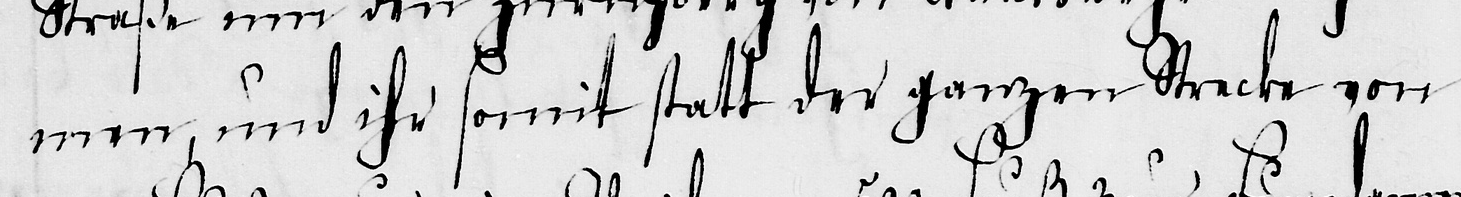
men, und ihr somit statt der ganzen Strecke von
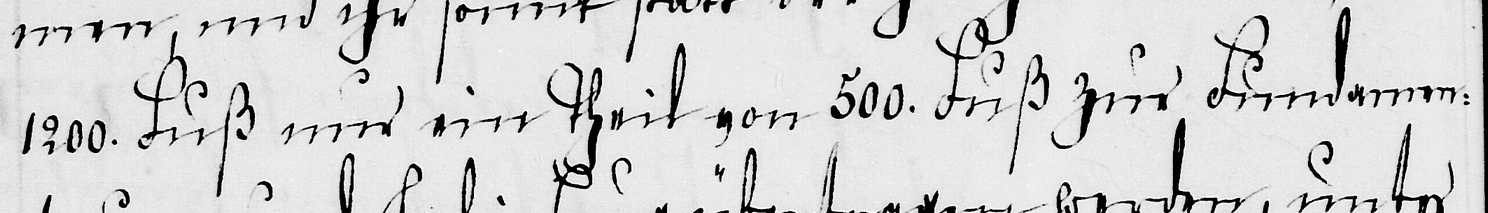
1200. Fuß nur ein Theil von 500. Fuß zur Fundamen¬
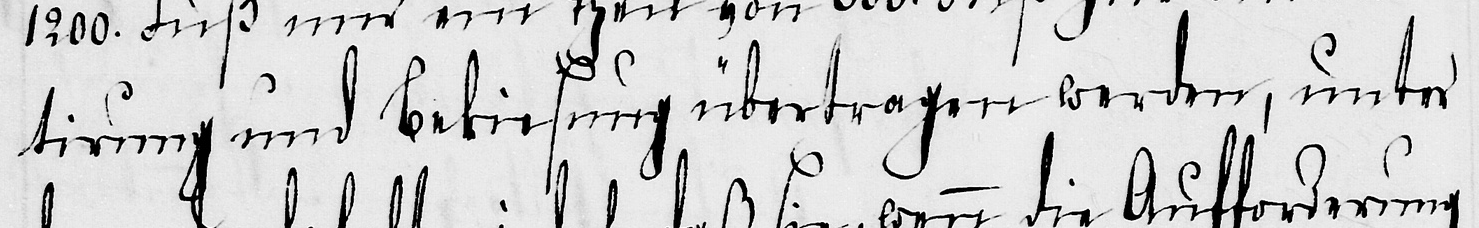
tirung und Bekiesung übertragen werden, unter
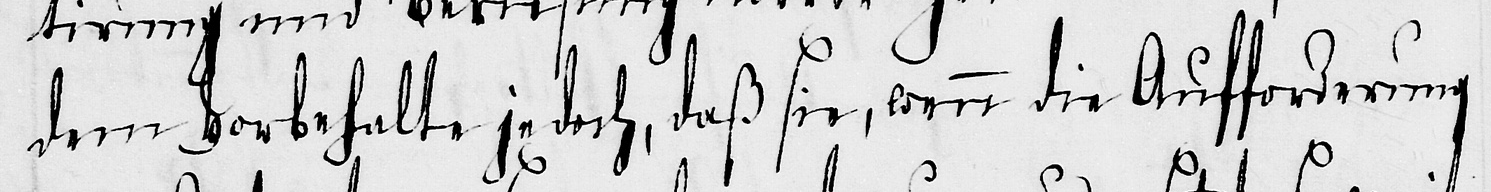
dem Vorbehalte jedoch, daß sie, wenn die Aufforderung
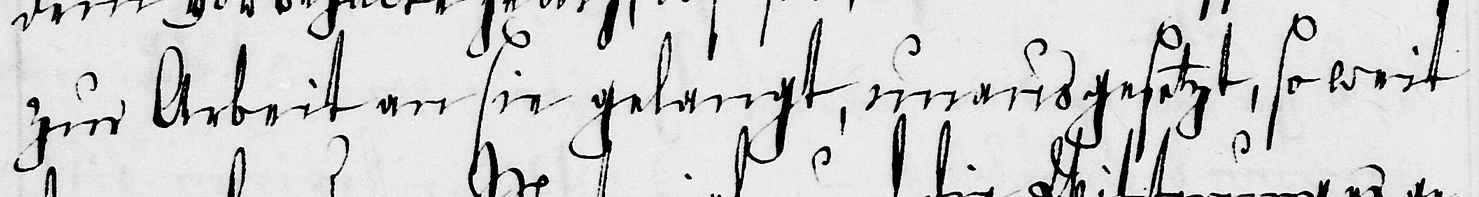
zur Arbeit an sie gelangt, unausgesetzt, so weit
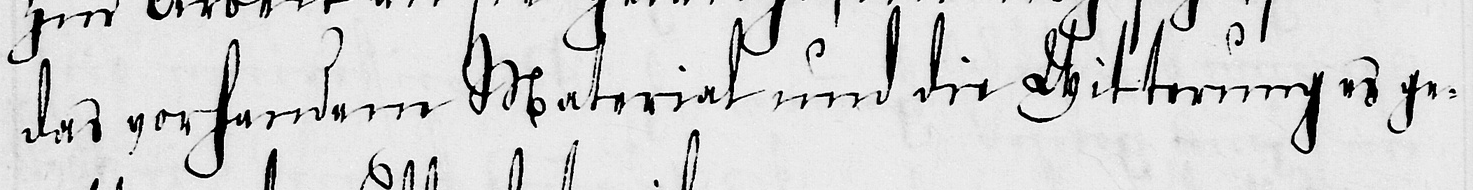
das vorhandene Material und die Witterung es ge¬
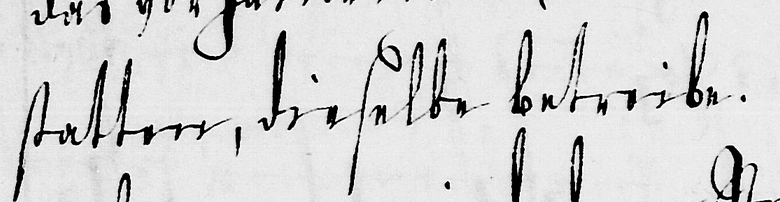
statten, dieselbe betreibe.
